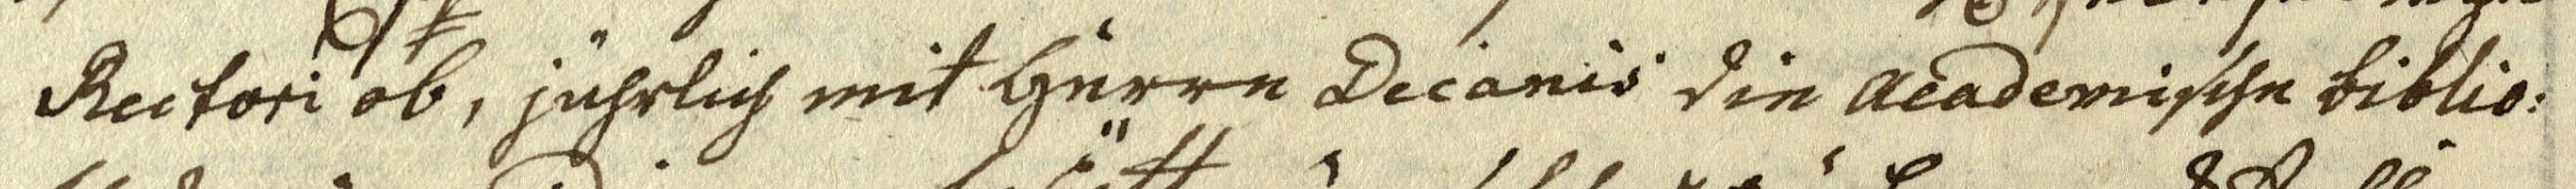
Rectori ob, jährlich mit Herrn Decanis die Academische Biblio¬
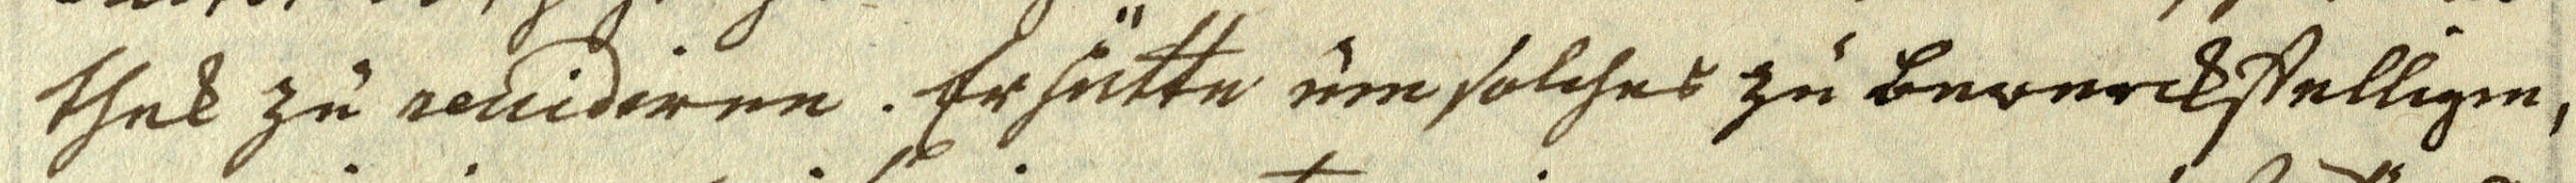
thek zu revidiren. Er hätte umsolches zu bewerckstelligen,
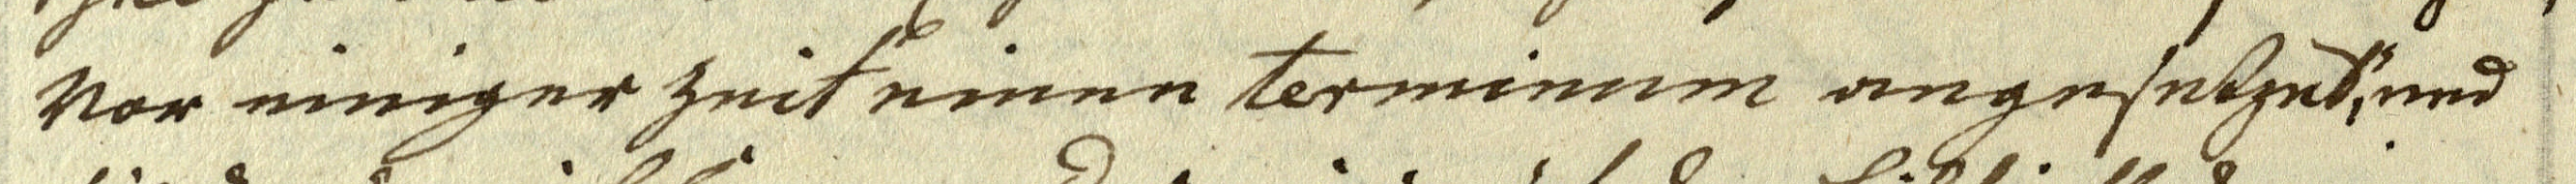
vor einiger Zeit einen Terminum angesetzet, und
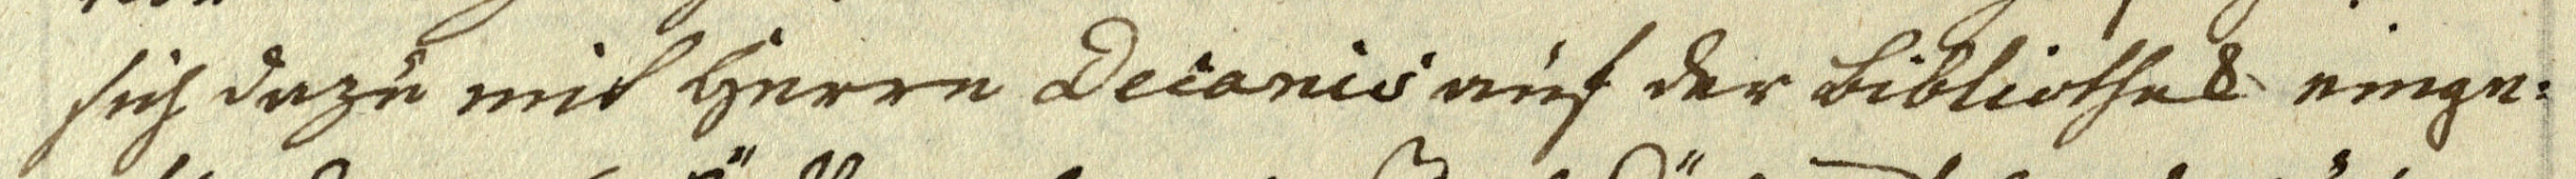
sich dazu mit Herrn Decanis auf der Bibliothek einge¬
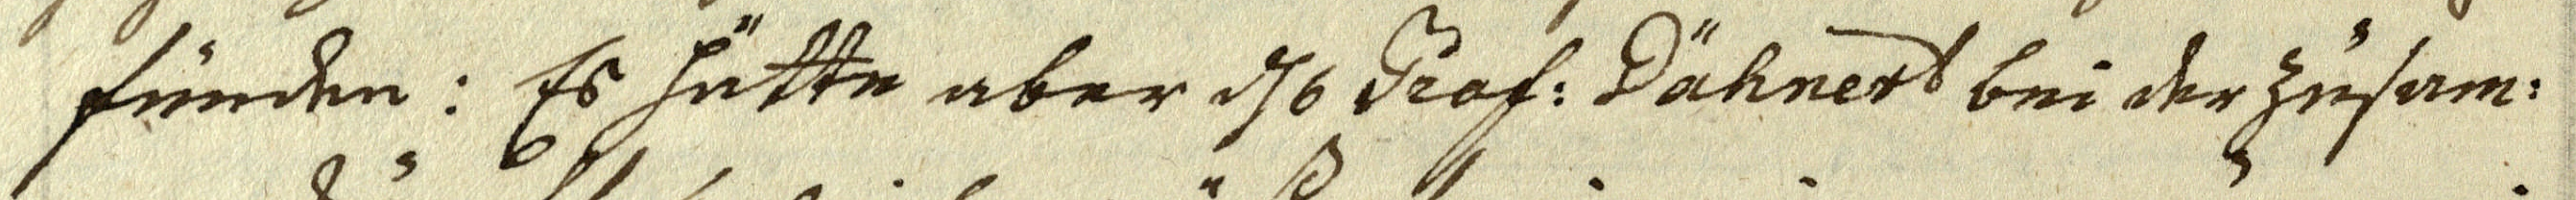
funden: Es hätte aber dh. Prof. Dähnert bei der Zusam¬
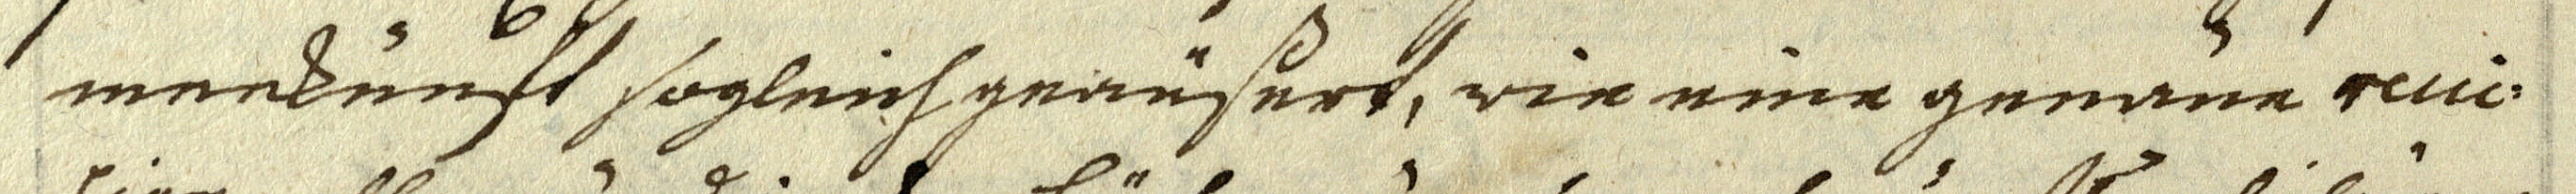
menkunft sogleich geäußert, wie eine genaue revi¬
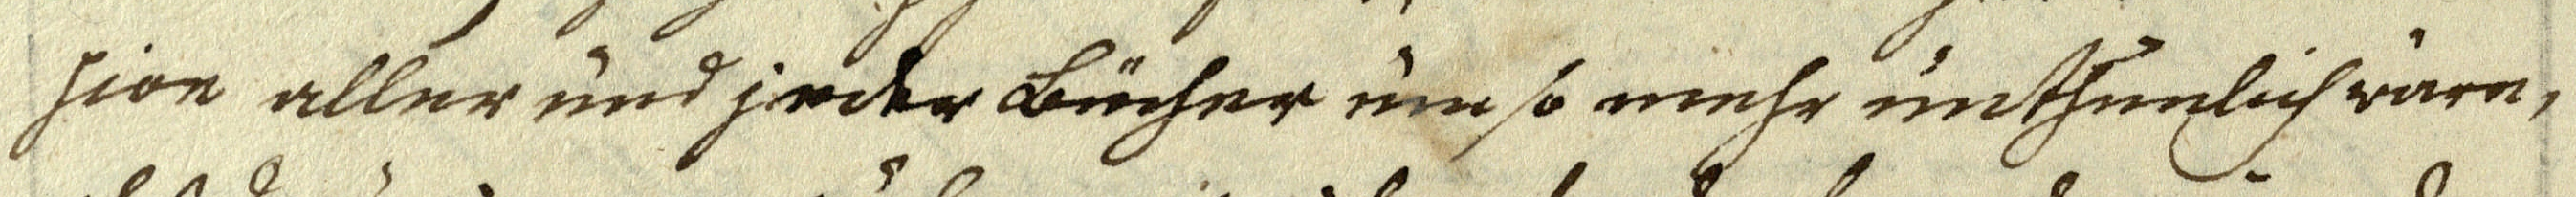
sion aller und jeder Bücher um so mehr unthunlich wäre,
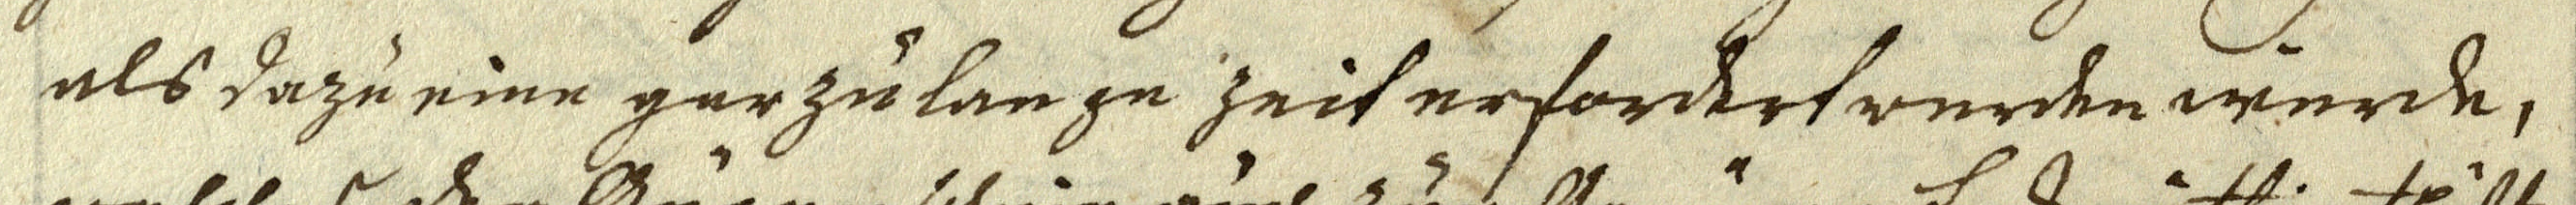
als dazu eine gar zu lange zeit erfordert werden würde,
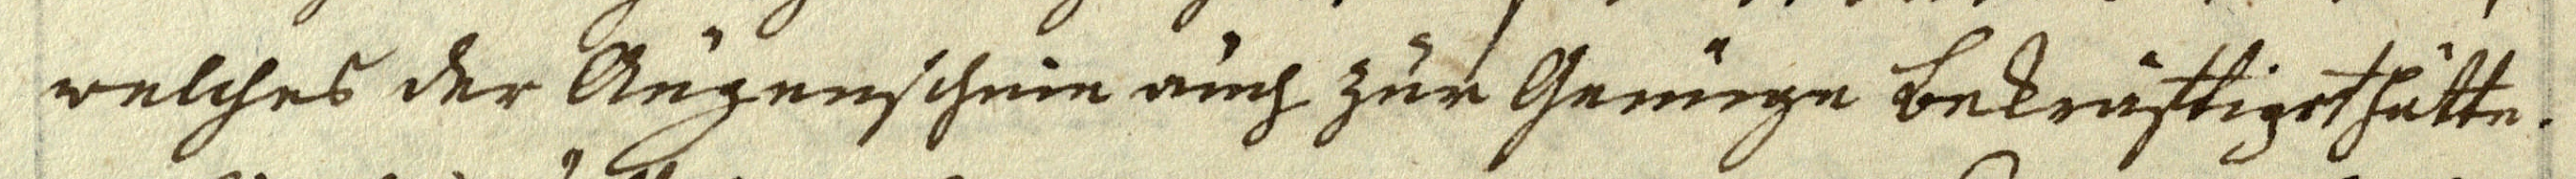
welches der Augenschein auch zur Genüge bekräftiget hätte.
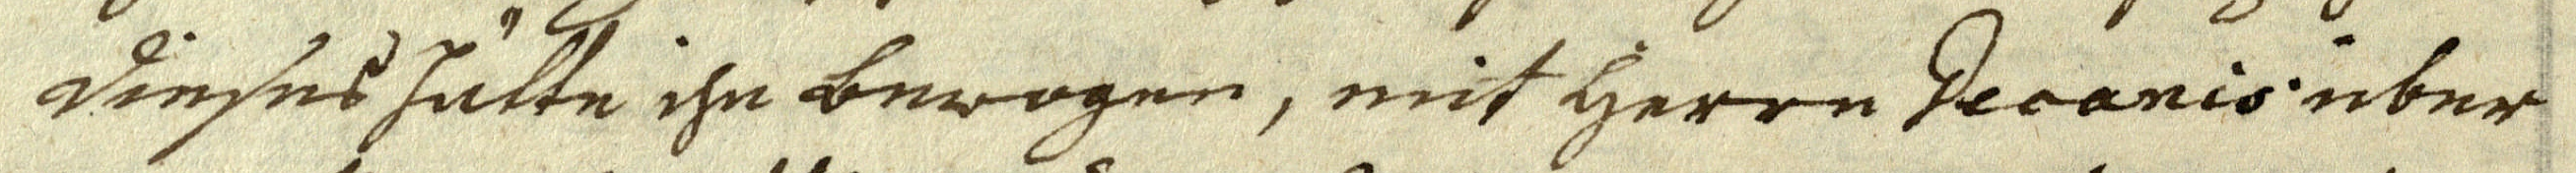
Dieses hätte ihn bewogen, mit Herrn Decanis über
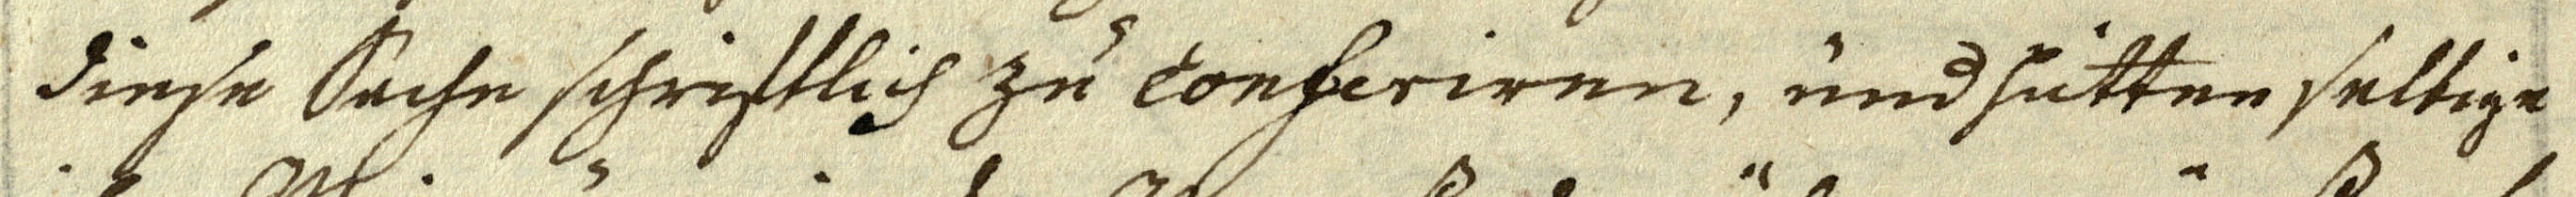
diese Sache schriftlich zu conferiren, und hätten selbige
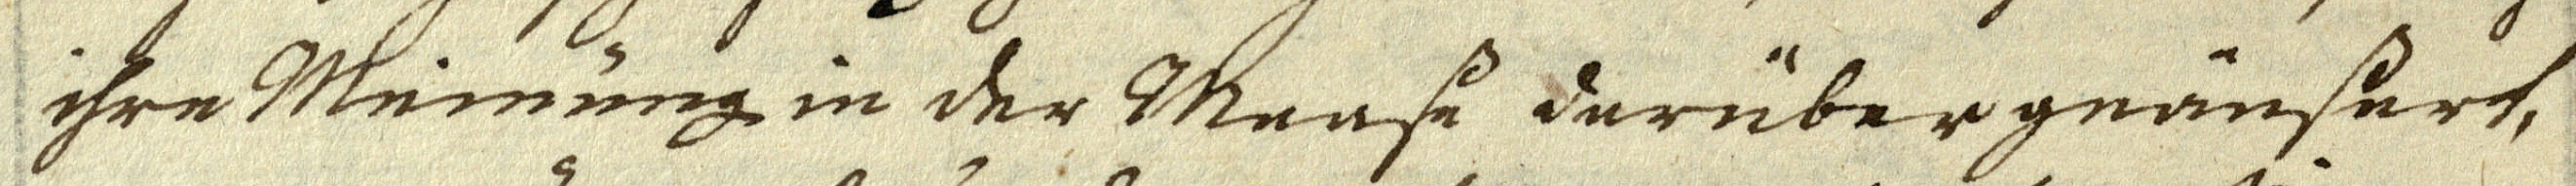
ihre Meinung in der Maaße darüber geäußert,
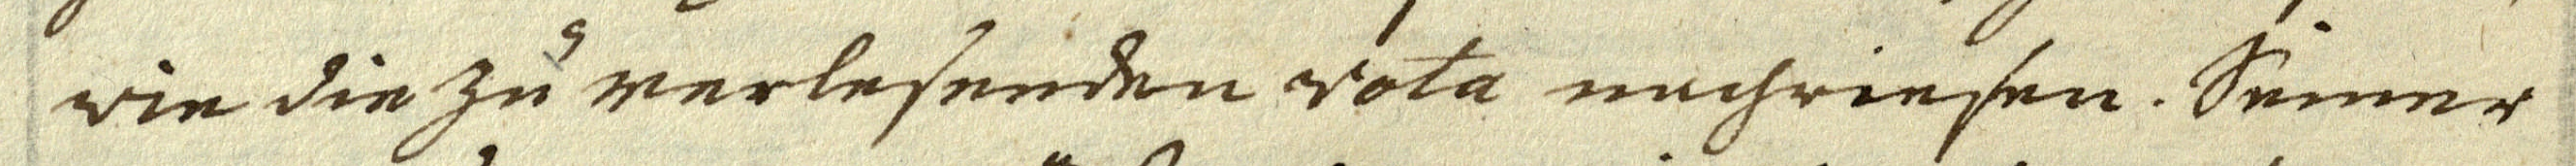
wie die zu verlesenden Vota nachwiesen. Seiner
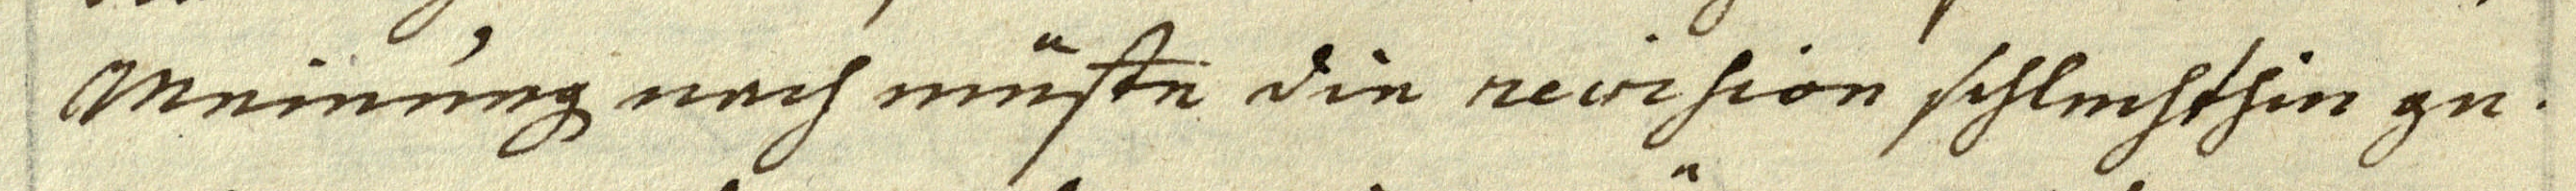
Meinung nach müste die revision schlechthin ge¬
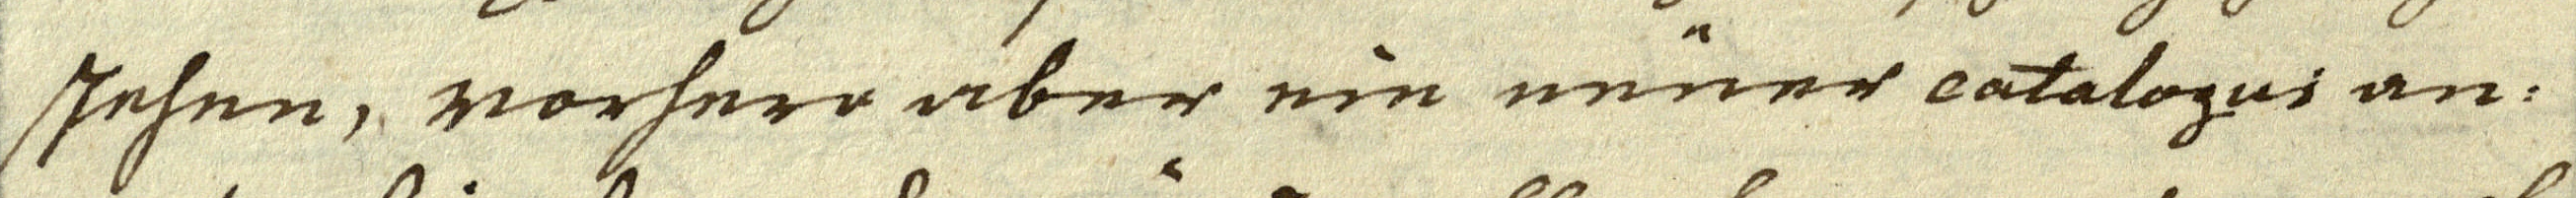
schehen, vorhero aber ein neuer catalogus an¬
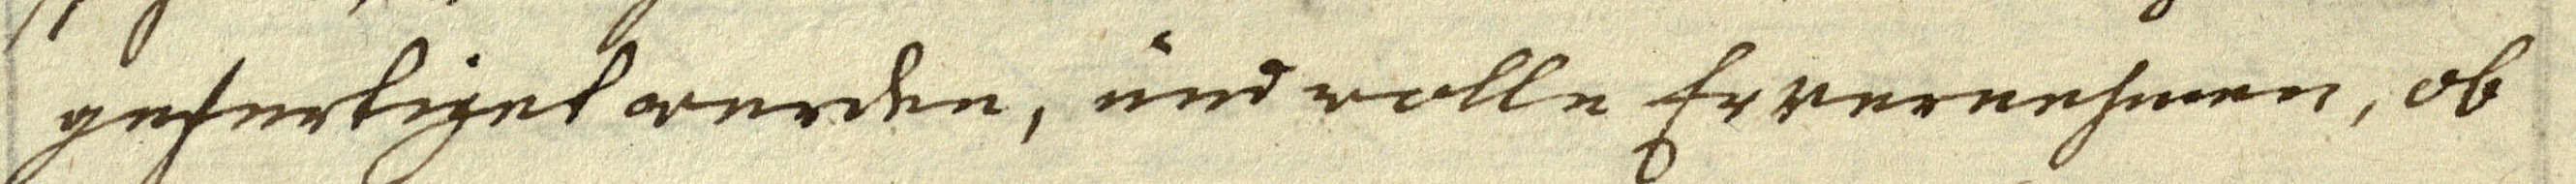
gefertiget werden, und wolle Er vernehmen, ob
